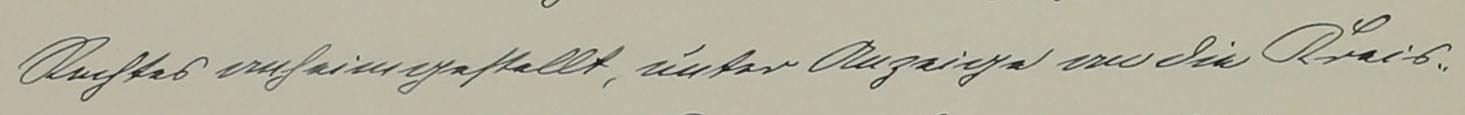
Rechtes anheimgestellt, unter Anzeige an die Kreis-
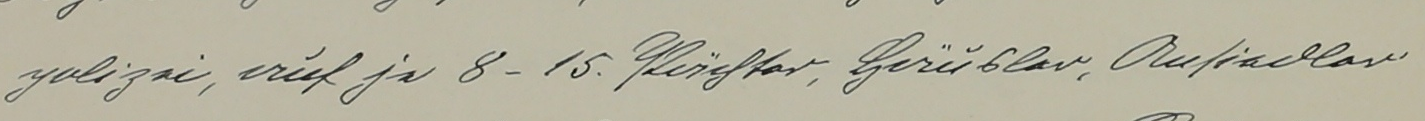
polizei, auf je 8-15. Pächter, Häusler, Ansiedler
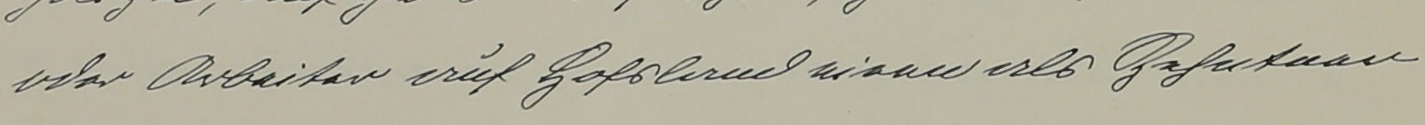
oder Arbeiter auf Hofsland einen als Zehntner
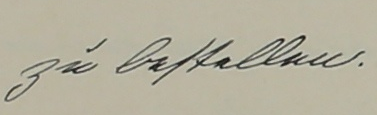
zu bestellen.
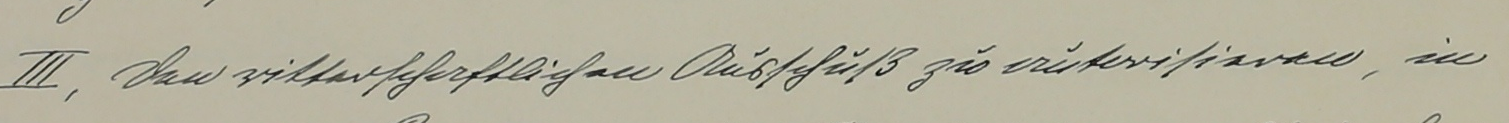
III. Den ritterschaftlichen Ausschuß zu autorisieren, in
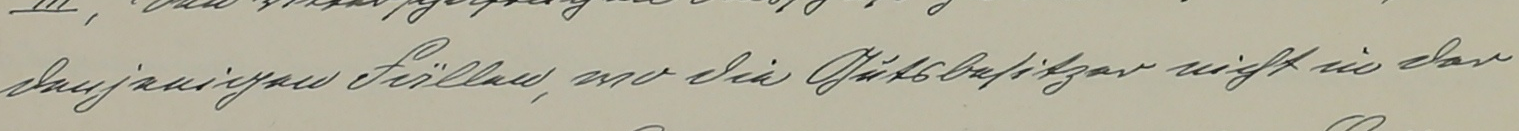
denjenigen Fällen, wo die Gutsbesitzer nicht in der
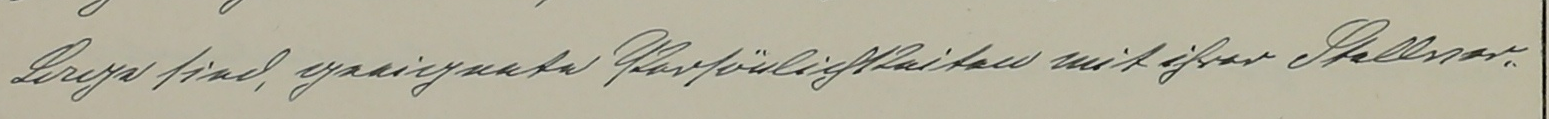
Lage sind, geeignete Persönlichkeiten mit ihrer Stellver-
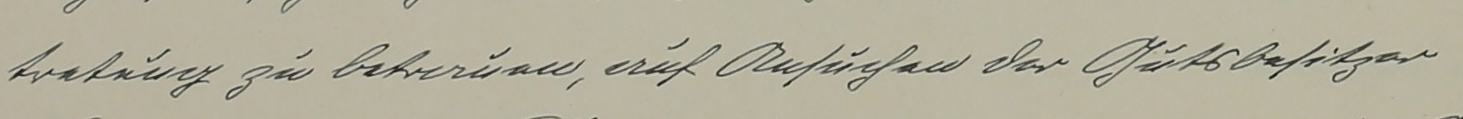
tretung zu betrauen, auf Ansuchen der Gutsbesitzer
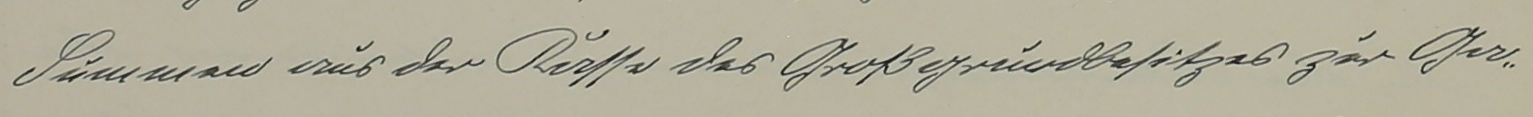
Summen aus der Kasse des Großgrundbesitzes zur Ga-
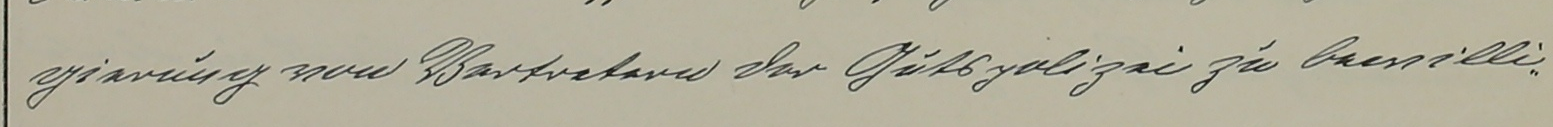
gierung von Vertretern der Gutspolizei zu bewilli-
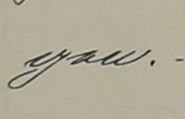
gen.
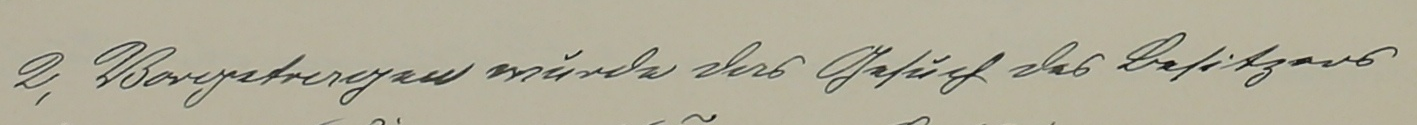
2. Vorgetragen wurde das Gesuch des Besitzers
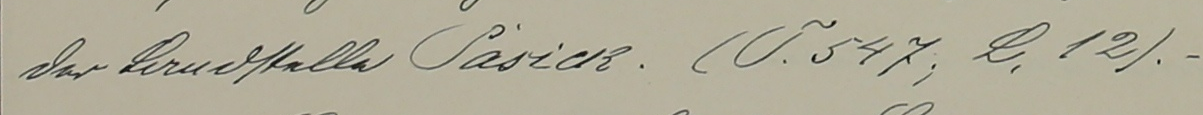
der Landstelle Pasick. (T.547; L.12).
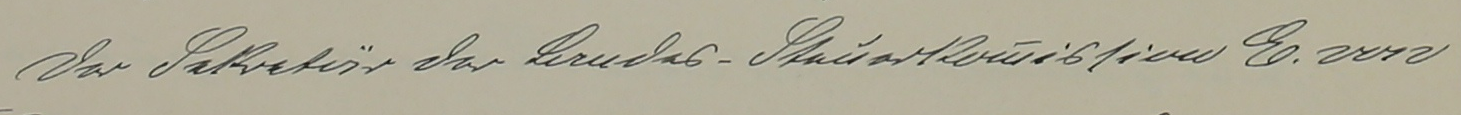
Der Sekretär der Landes-Steuerkommission E. von
